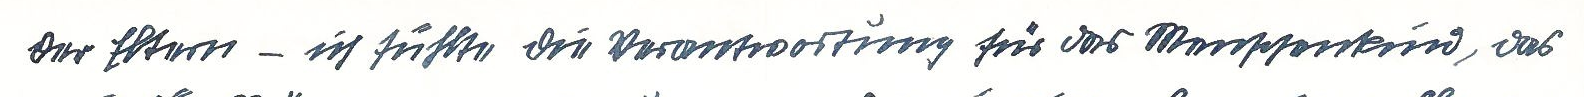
der Eltern – ich fühlte die Verantwortung für das Menschenkind, das
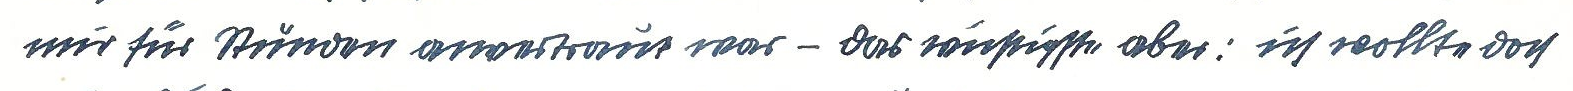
mir für Stunden anvertraut war – das wichtigste aber: ich wollte doch
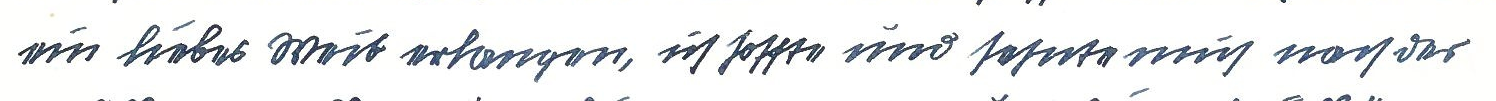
ein liebes Weib erlangen, ich hoffte und sehnte mich nach der
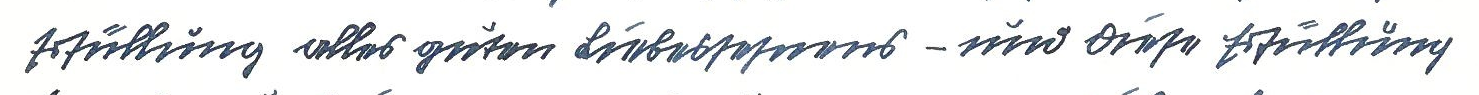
Erfüllung alles guten Liebessehnens – und diese Erfüllung
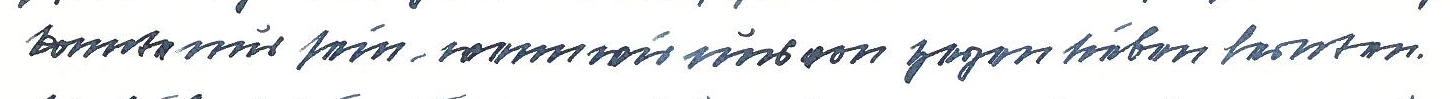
konnte nur sein, wenn wir uns von Herzen lieben lernten.
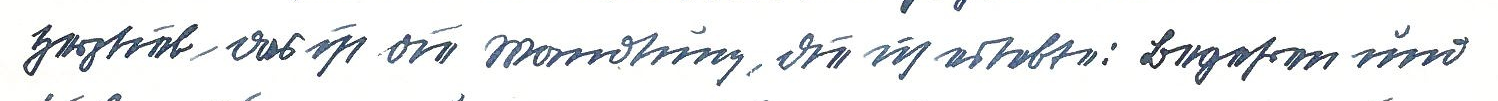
Herzlieb, das ist die Wandlung, die ich erlebte: Begehren und
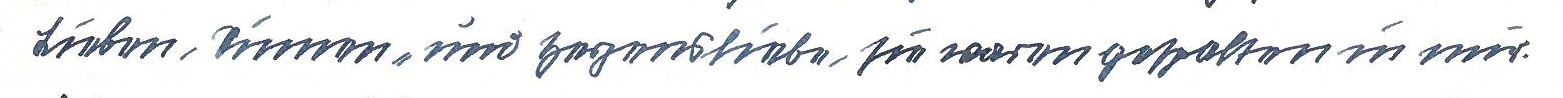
Lieben, Sinnen- und Herzensliebe, sie waren gespalten in mir.
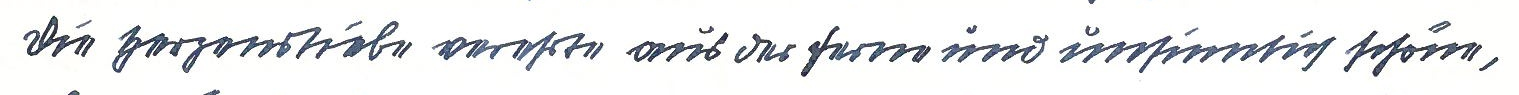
Die Herzensliebe verehrte aus der Ferne und unsinnlich schöne,
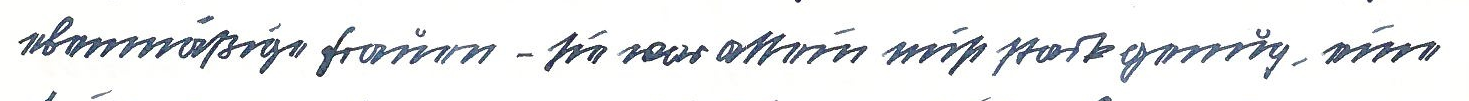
ebenmäßige Frauen – sie war allein nicht stark genug, eine
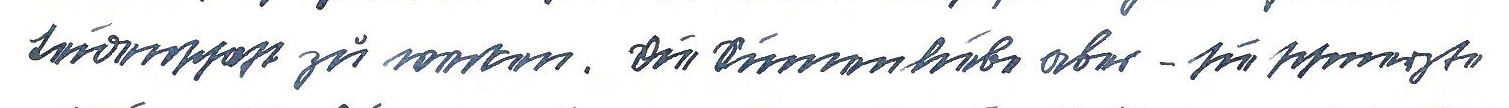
Leidenschaft zu wecken. Die Sinnenliebe aber – sie schmerzte
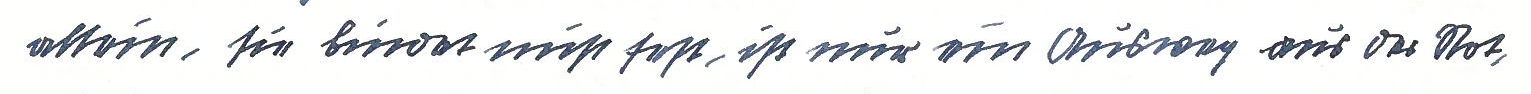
allein, sie bindet nicht fest, ist nur ein Ausweg aus der Not,
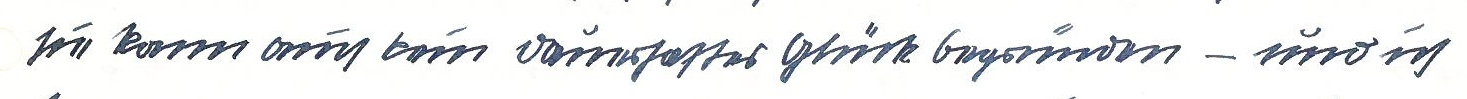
sie kann auch kein dauerhaftes Glück begründen — und ich
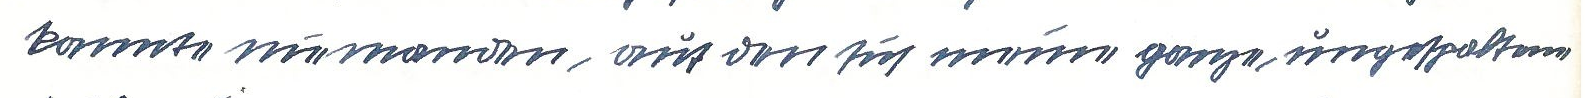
kannte niemanden, auf den sich meine ganze, ungespaltene
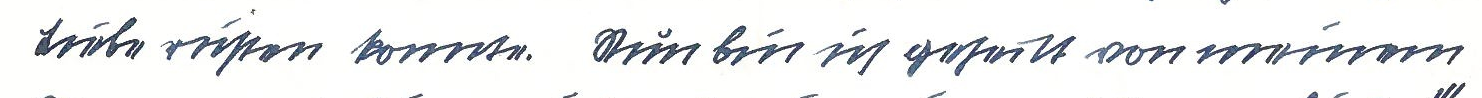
Liebe richten konnte. Nun bin ich geheilt von meinem
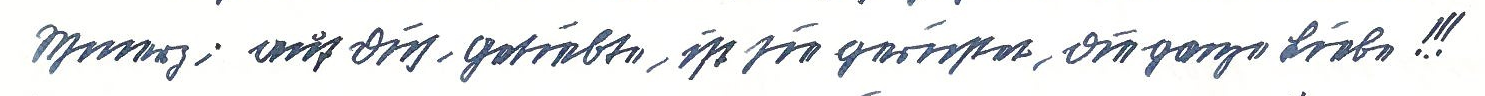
Schmerz; auf Dich, Geliebte, ist sie gerichtet, die ganze Liebe!!!
